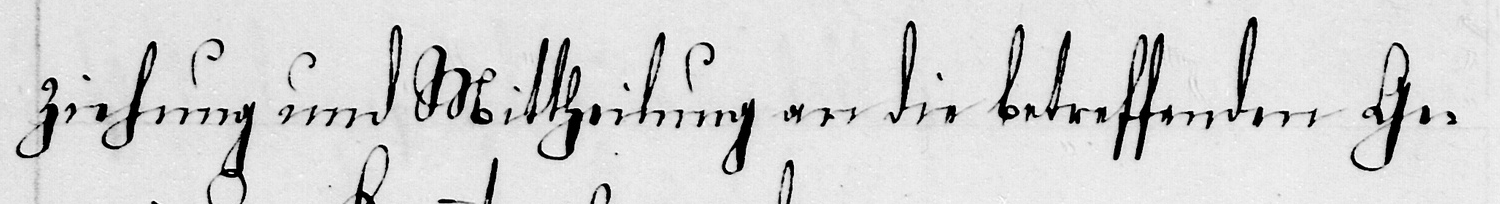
ziehung und Mittheilung an die betreffenden Ge¬
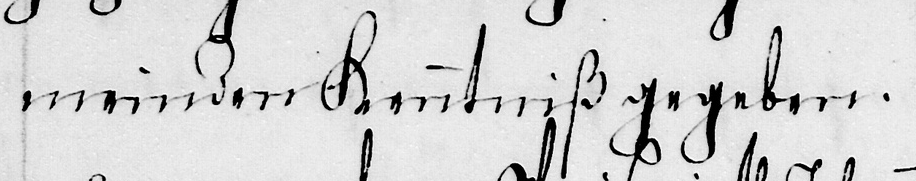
meinden Kenntniß gegeben.
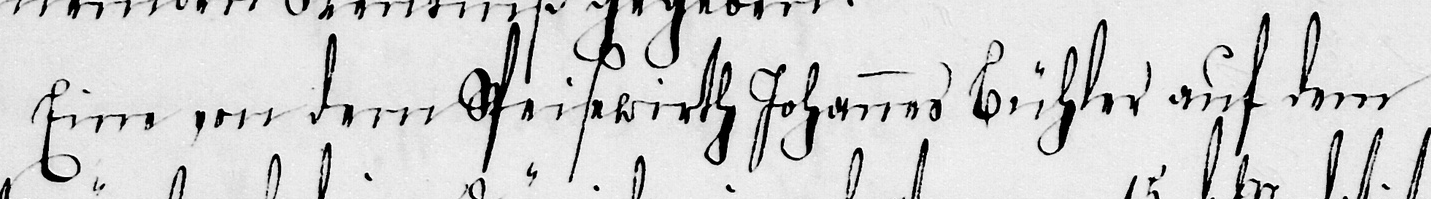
Eine von dem Speisewirth Johannes Bühler auf dem
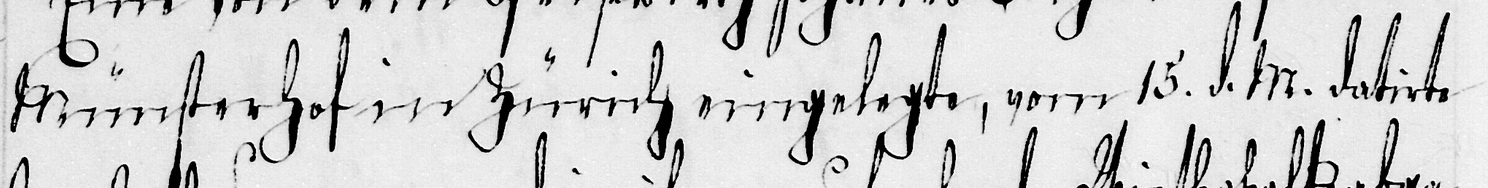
Münsterhof in Zürich eingelegte, vom 15. d. M. datirte
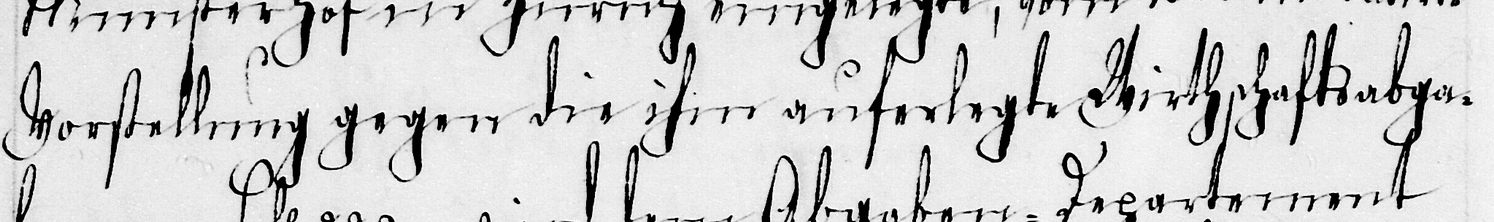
Vorstellung gegen die ihm auferlegte Wirthschaftsabga¬
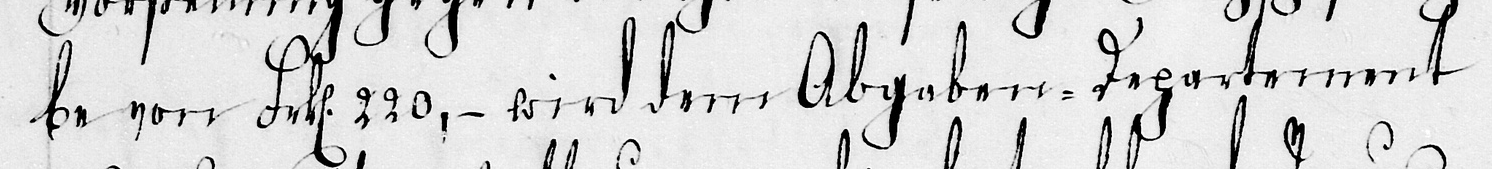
be von Frk[en]. 220, – wird dem Abgaben-Departement
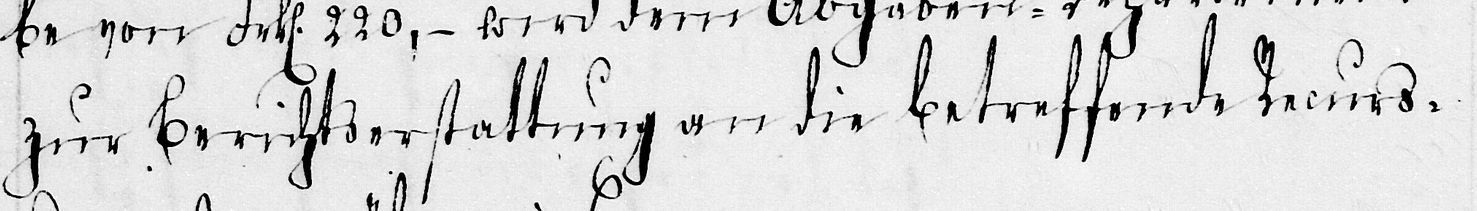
zur Berichtserstattung an die betreffende Recur¬
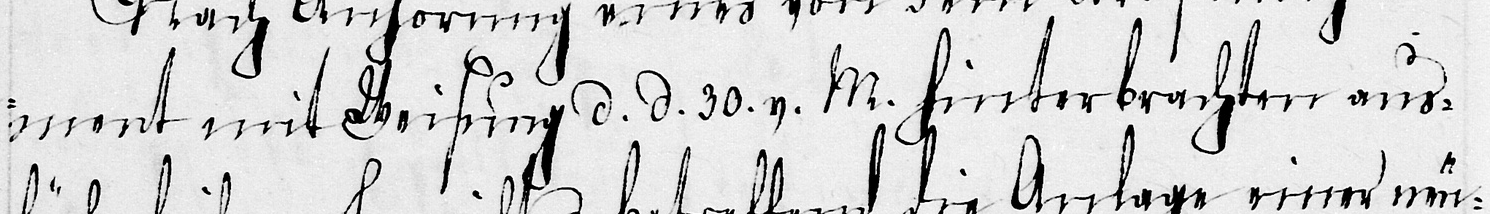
ment mit Weisung d. d. 30. v. M. hinterbrachten aus¬
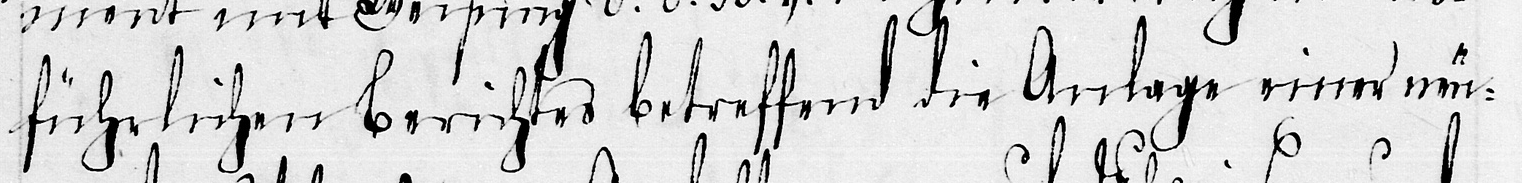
führlichen Berichtes betreffend die Anlage einer neu¬
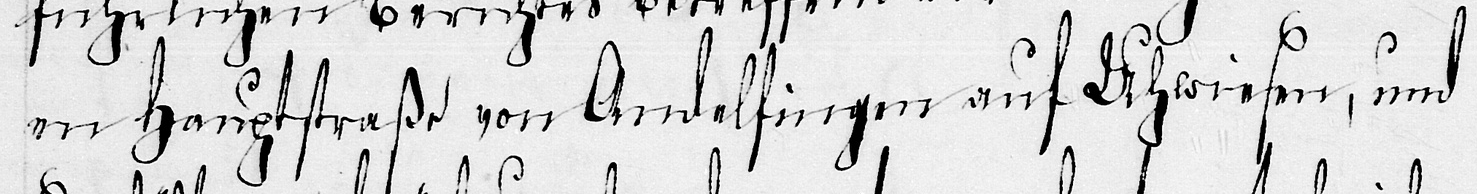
en Hauptstraße von Andelfingen auf Uhwiesen, und
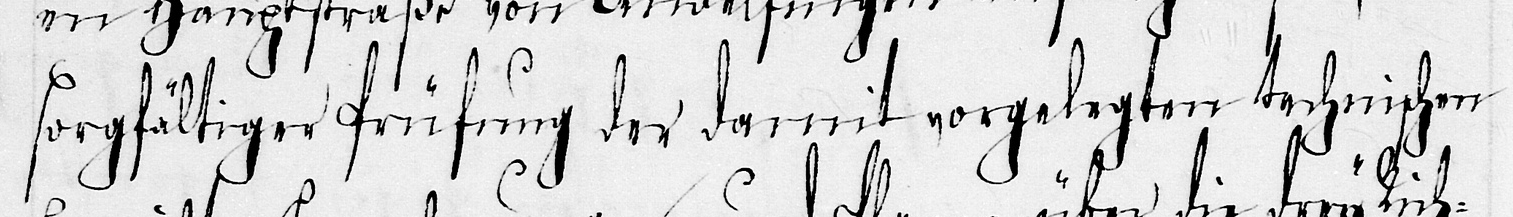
sorgfältiger Prüfung der damit vorgelegten technischen
